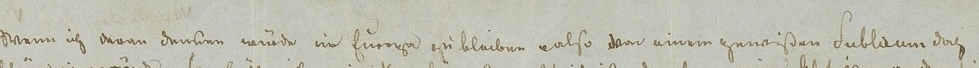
Wenn ich daran denken würde in Europa zu bleiben & also von einem gewißen Publicum doch
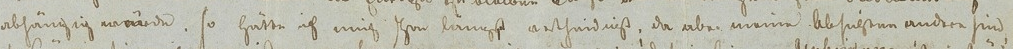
abhängig würde, so hätte ich mich schon längst vertheidigt, da aber meine Absichten andere sind,
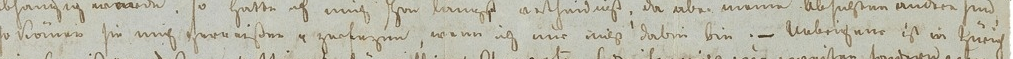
so können sie mich zerreißen & zerfezen, wenn ich nur nicht dabei bin. – Uebrigens ist in Zürich
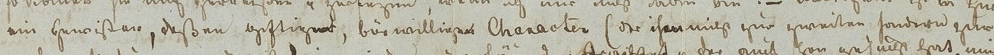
ein Gewißer, deßen giftiger, böswilliger Character (der ihm nicht zur zweiten sondern zur
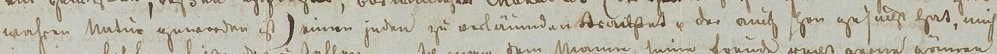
wahren Natur geworden ist) einen jeden zu verläumden trachtet & der auch schon gesucht hat, mich
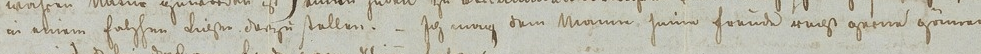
in einem falschen Lichte darzustellen. – Ich mag dem Manne seine Freude recht gerne gönnen,
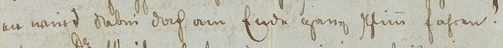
er wird dabei doch am Ende ganz schlimm fahren.
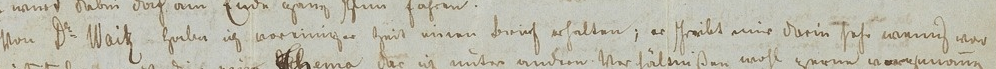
Von DrWaitz habe ich vor einiger Zeit einen Brief erhalten; er schreibt mir darin sehr wenig von
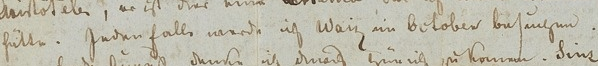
hätte. Jedenfalls werde ich Waitz im October besuchen.
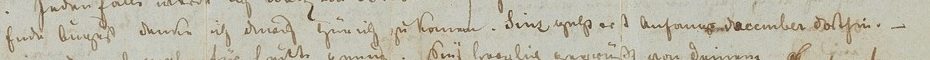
Ende August denke ich durch Zürich zu komen. Sinz geht erst Anfangs December dorthin. –
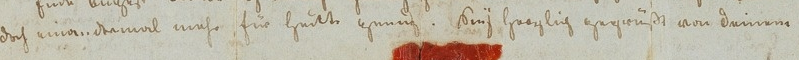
Doch einandermal mehr, für heute genug. Sey herzlich gegrüßt von Deinem
